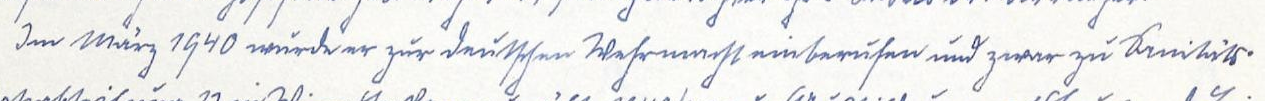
Im März 1940 wurde er zur deutschen Wehrmacht einberufen und zwar zu Sanitäts-
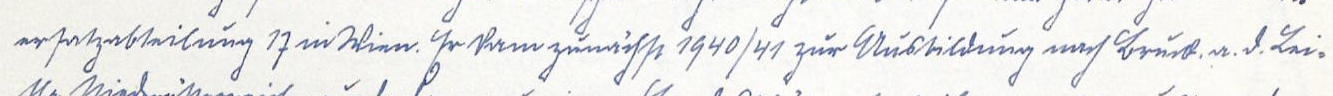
ersatzabteilung 17 im Wien. r kam zunächst 1940/41 zur Ausbildung nach Bruck a d. Lei-
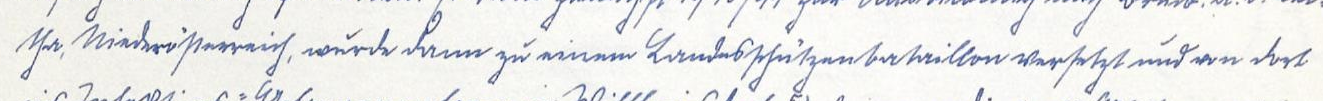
tha, Niederösterreich, wurde dann zu einem Landesschützenbataillon versetzt und von dort
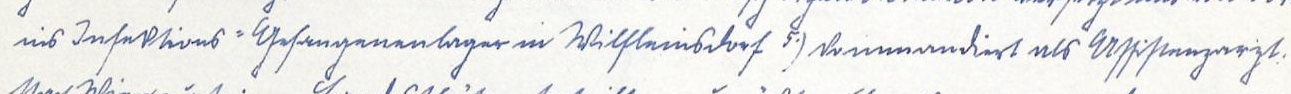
ins Infektions- Gefangenenlager in Wilfleinsdorf 5) kommandiert, als Assistenzarzt
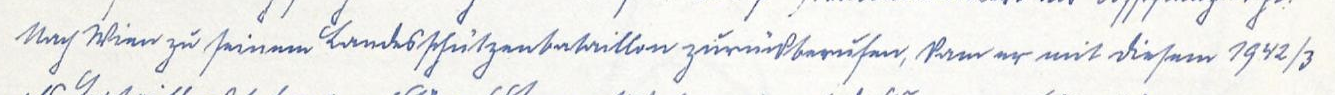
nach Wien zu seinem Landesschützenbataillon zurückberufen, kam er mit diesem 1942/3
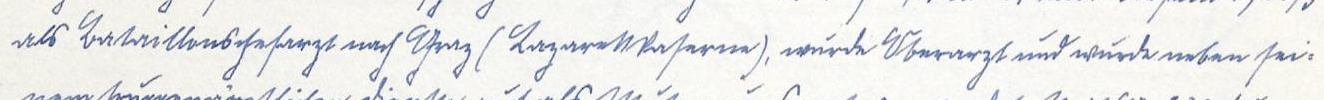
als Bataillonschefarzt nach Graz (Lazarettkaserne), wurde Oberarzt und wurde neben sei-
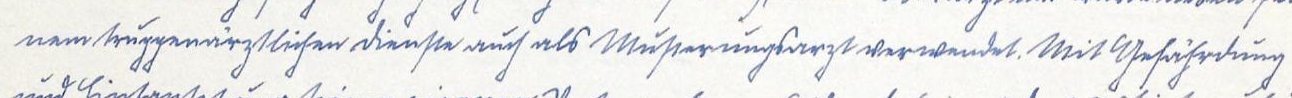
nem truppenärztlichen Dienste auch als Musterungsarzt verwendet. Mit Gefährdung
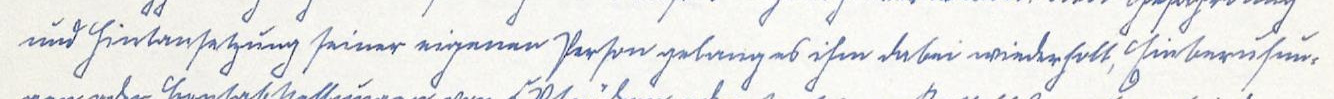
und Hintansetzung seiner eigenen Person gelang es ihm dabei wiederholt, Einberufun-
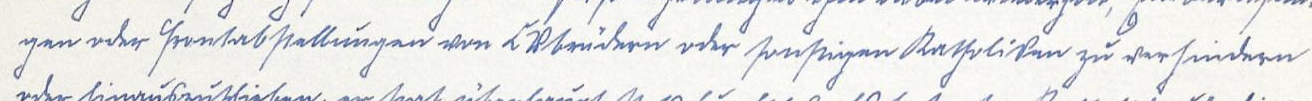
gen oder Frontabstellungen von CVbrüdern oder sonstigen Katholiken zu verhindern
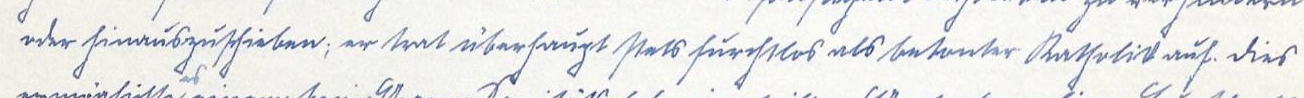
oder hinauszuschieben; er trat überhaupt stets furchtlos als betonter Katholik auf. Dies
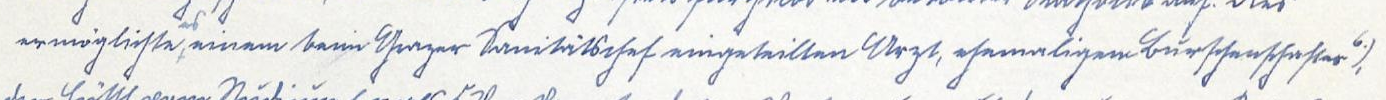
ermöglichte einem bei Grazer Sanitätschef eingeteilten Arzt, ehemaligenm Burschenschafter 6)
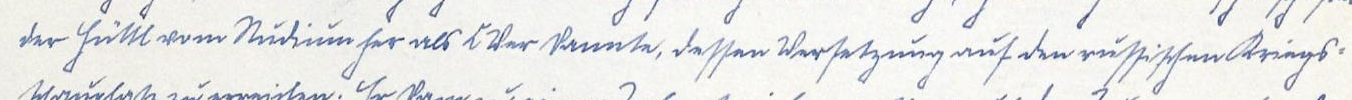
der Hüttl vom Studium her als CVer kannte, dessen Versetzung auf den russischen Kriegs-
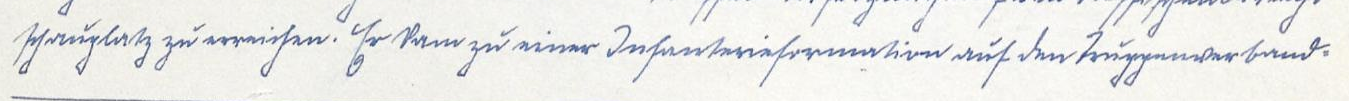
schauplatz zu erreichen. Er kam zu einer Infanterieformation auf den Truppenverband-
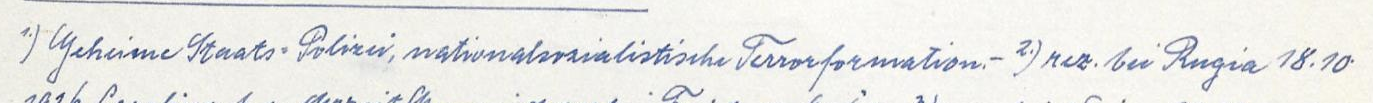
1) Geheime Staats- Polizei, nationalsozialistische Terrorformation.-2) rez. bei Rugia 18.10
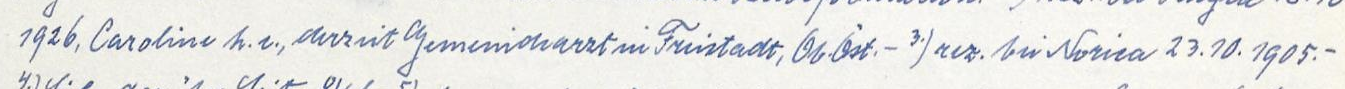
1926, Caroline h. c, derzeit Gemeindearzt in Freistadt, Ob.Öst. 3) rez. bei Norica 23.10.1905.-
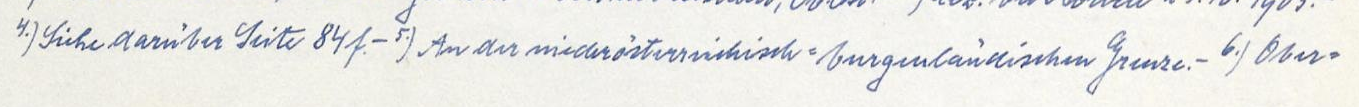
4.) Siche darüber Seite 84f. 5) An der niederösterreichisch-burgenländischen Genze.- 6) Ober-
